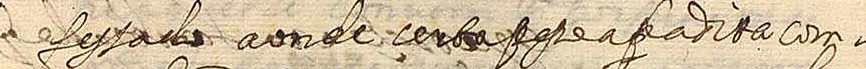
fessado aonde certa pessoas da dita com
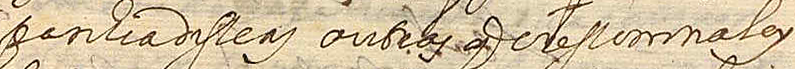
panhia disse as outras q̄ cressem na Ley
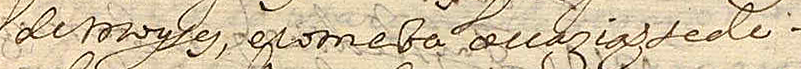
de moyses, e com esta occaziaõ se de
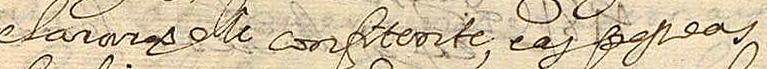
clararaõ elle confitente, e as pessoas
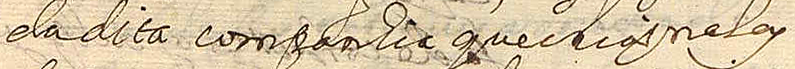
da dita companhia que criaõ na Ley
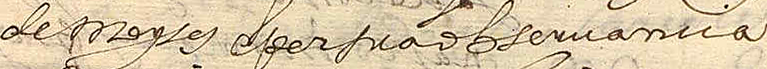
de moyses e por sua obseruancia
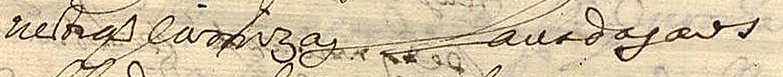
uestiaõ camizas Lauadas aos
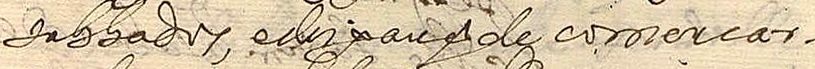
sabbados, e deixauaõ de comer car
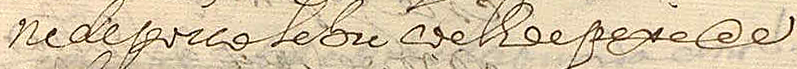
ne de porco Lebre coelho pexe de
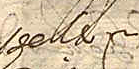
pelle
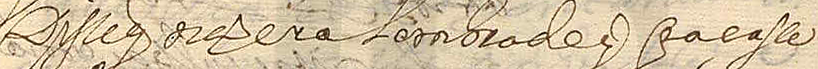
Disse q̄ naõ era Lembrado q̄ paçasse
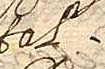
tal.
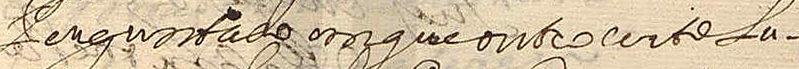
Perguntado em que outro certo Lu
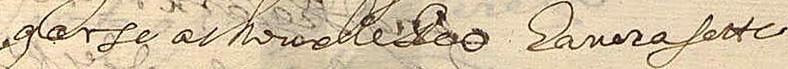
gar se achou elle Reo hauera sette
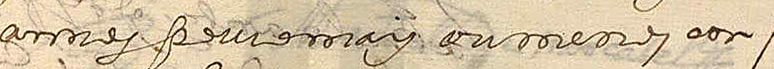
annos pouco mais ou menos com
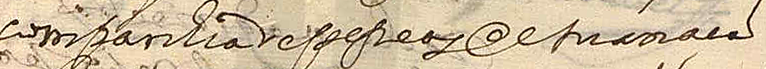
companhia de pessoas de sua naçaõ
